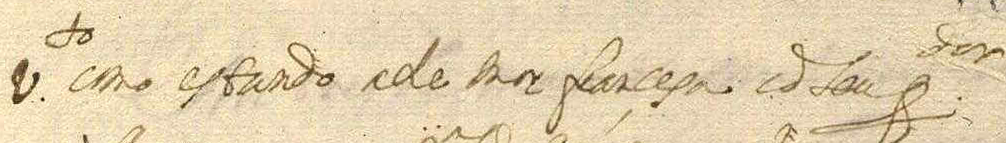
v.to como estando a de mor francesa cō seu p.dor
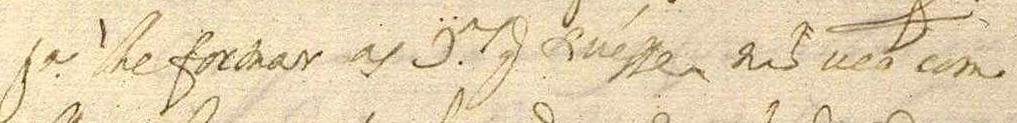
pa. lhe formar as ꝯ̄.as q̄ tiuesse naõ ueo com
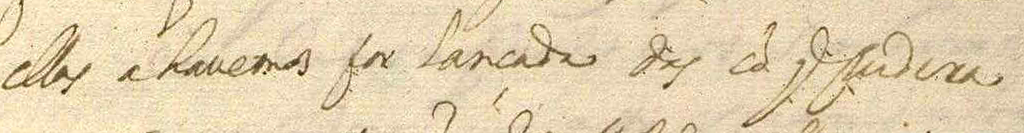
ellas a hauemos por lançada das cō q̄ pudera
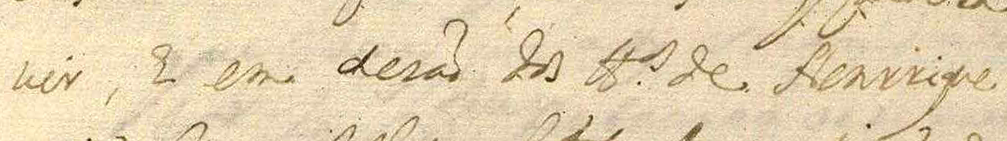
uir, E em rezaõ dos tt.os de Henrrique
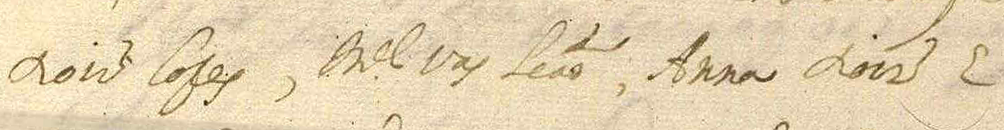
Roiz̄ lopes, M.el vas Leaõ, Anna Roiz̄ E
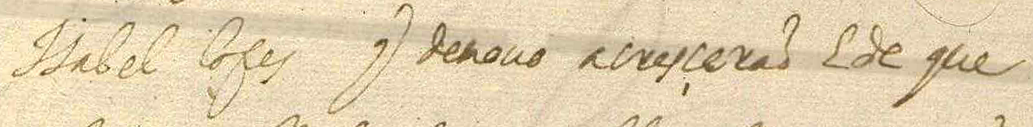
Isabel lopes q̄ de nouo acresceraõ E de que
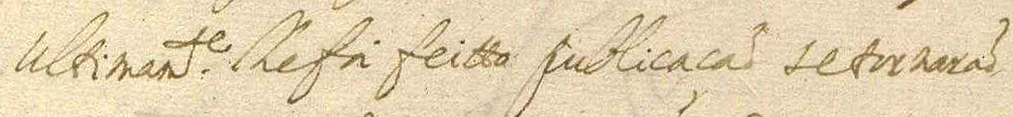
ultimamte. lhe foi feitto publicaçaõ se tornaraõ
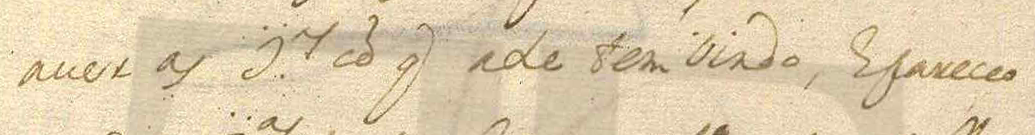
a uer as ꝯ̄.as cō q̄ a re tem vindo, E pareceo
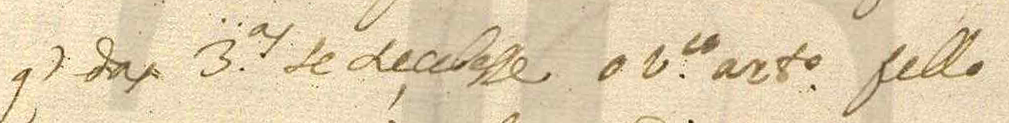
q̄ das 3.as se reçebesse o v.co arto. pello
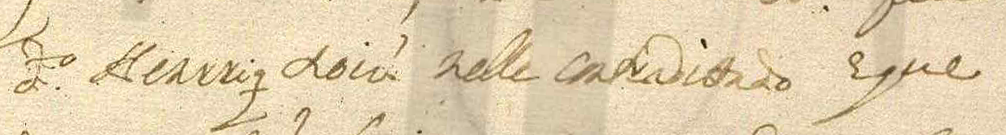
d̄.o Henrriꝗ Roiz̄ nelle contradittado E que
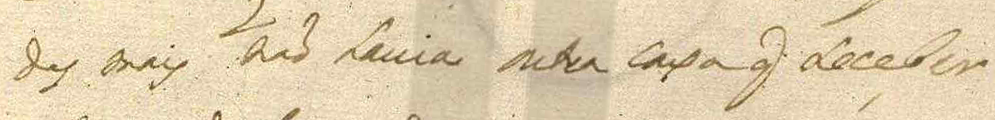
das mais naõ hauia outra coisa q̄ Receber
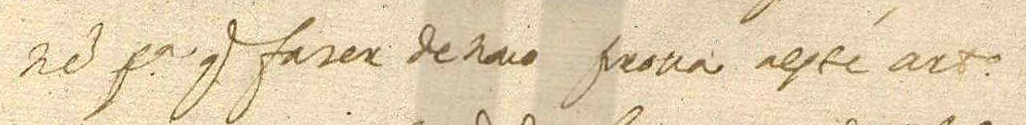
nē p.a q̄ fazer de nouo proua a este arto.
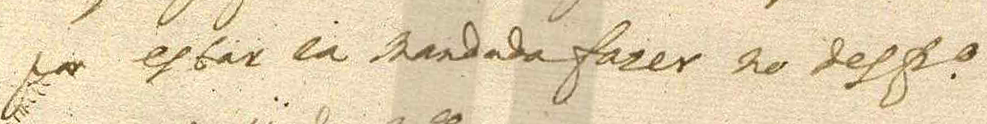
por estar ia mandada fazer no desp.o
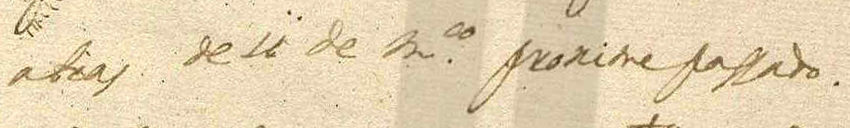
atras de 11 de m.co proxime passado.
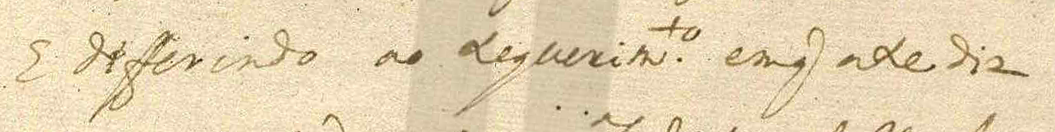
E differindo ao requerim.to em q̄ a re diz
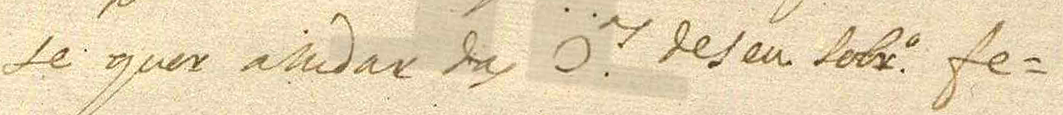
se quer aiudar das ꝯ̄.as de seu sobr.o fe
